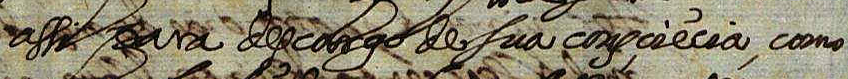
assi para descargo de sua consciēcia como
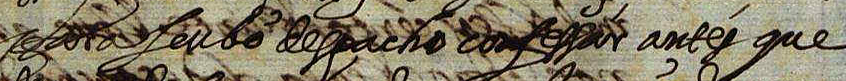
para seu bō despacho confessar antes que
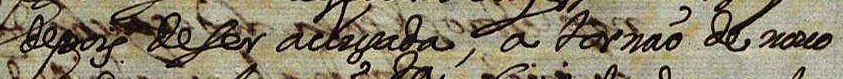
depois de ser accusada, a tornaõ de nouo
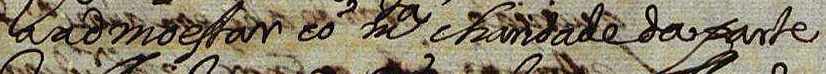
a admoestar cō mta charidade da parte
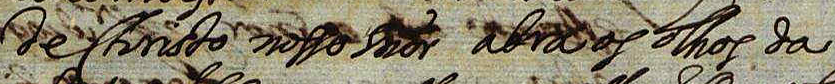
de Christo nosso snōr abra os olhos da
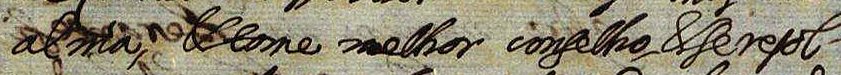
alma, & tome melhor conselho, & se resol
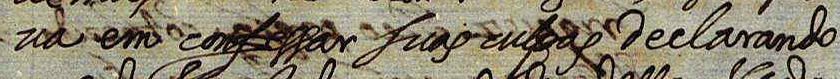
ua em confessar suas culpas declarando
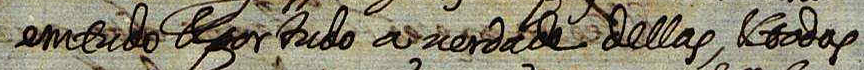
em tudo & por tudo a uerdade dellas, & todas
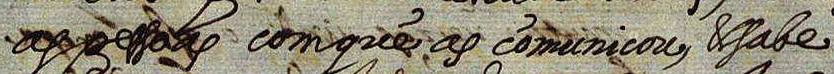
as pessoas com quē as cōmunicou, & sabe
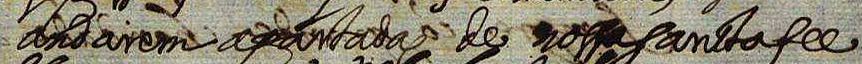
andarem apartadas de nossa sancta fee
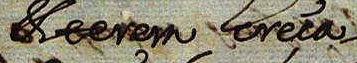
& terem crēça
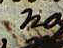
na
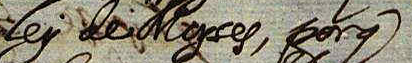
Ley de Moyses, porq̄
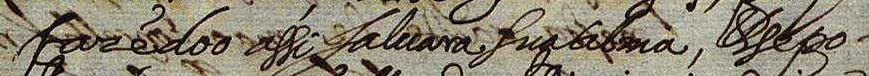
fazēdoo assi saluara sua alma, & se po
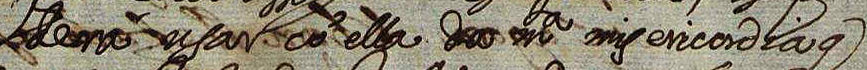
dera usar cō ella da mta misericordia q̄
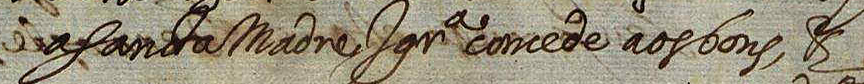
a sancta Madre Jgra concede aos bons, &
